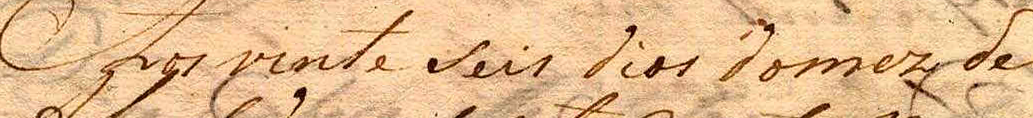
Aos vinte seis dias do mez de
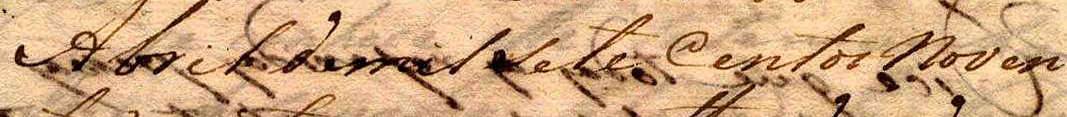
Abril de mil seteCentos Noven
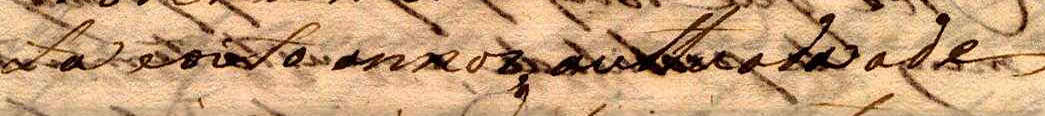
ta e oito annos, auttuada a de
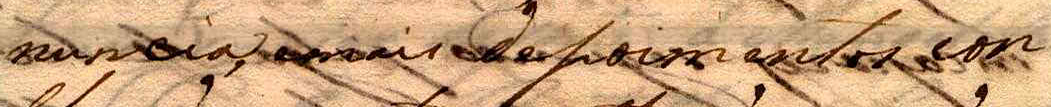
nuncia, e mais depoimentos con
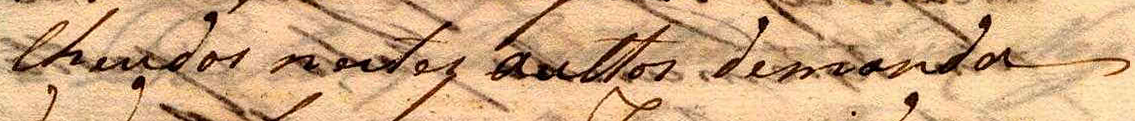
theudos nestes auttos demanda
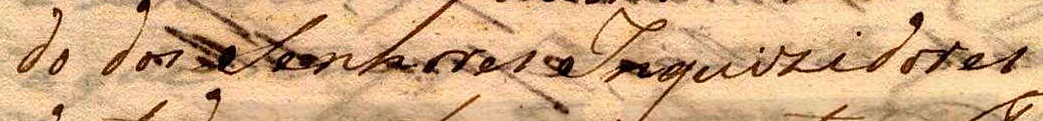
do dos Senhores Inquizidores
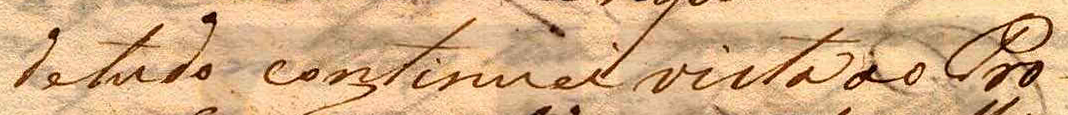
de tudo continuei vista ao Pro
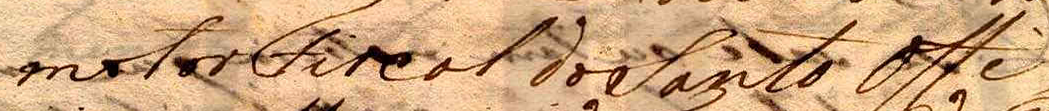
motor Fiscal do Santo Offi
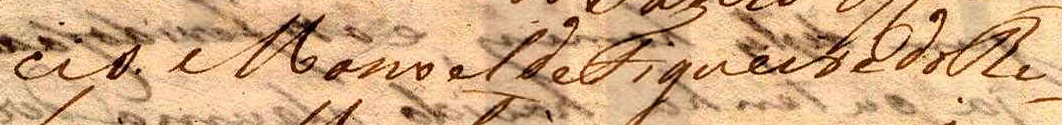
cio. Manoel de Figueiredo Ri
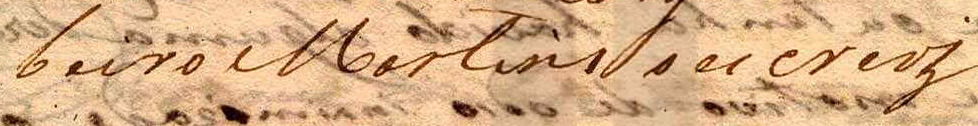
beiro Martins o escrevj.
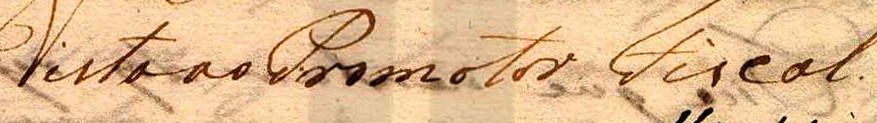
Visto ao Promotor Fiscal.
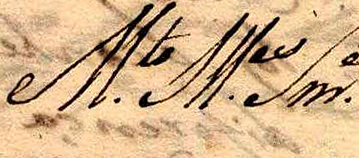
M.to Ill.es Snr.es
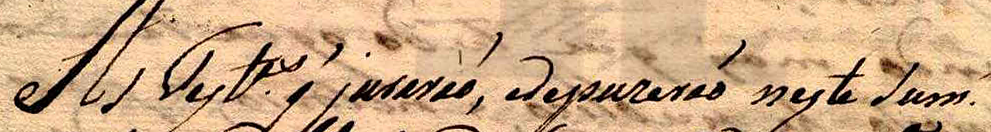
As Test.as q̄ juraraõ, e depuzeraõ neste Sum̄.o
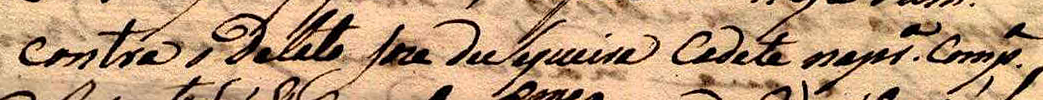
contra o delato Joze de Sequeira Cadete na pr.a comp.a
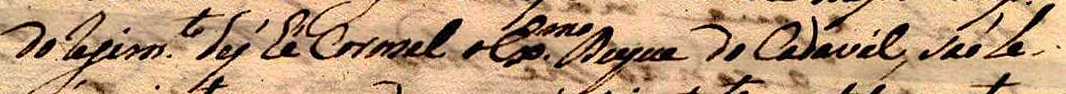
do Regim.to de q̄ hé Coronel o Ex.mo Duque do Cadavál, saõ le
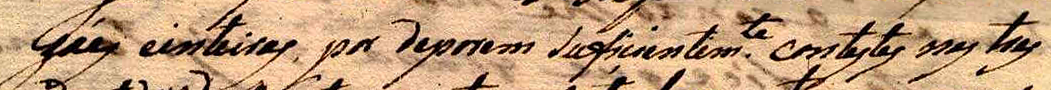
gáes e inteiras, por deporem suficientem.te contestas nas tres
